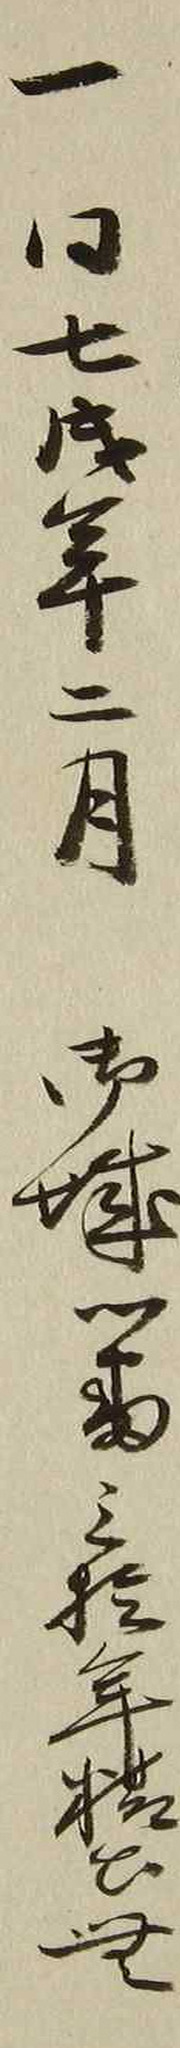一同七戌年二月御城御番三拾年精出無
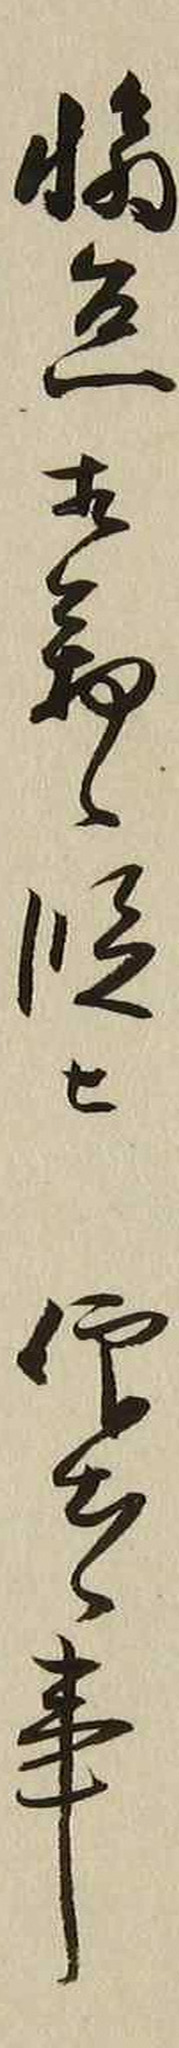懈怠相勤候段被仰出候事
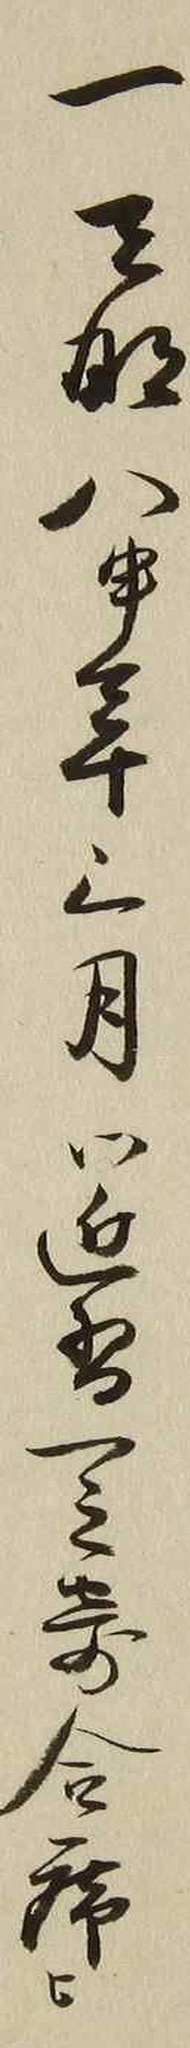一天明八申年三月御近習一之寄合席被
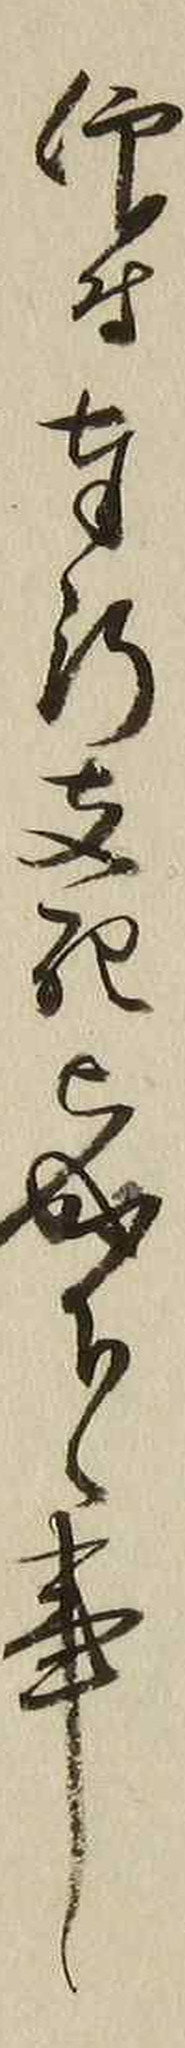仰付奉行支配被成下候事
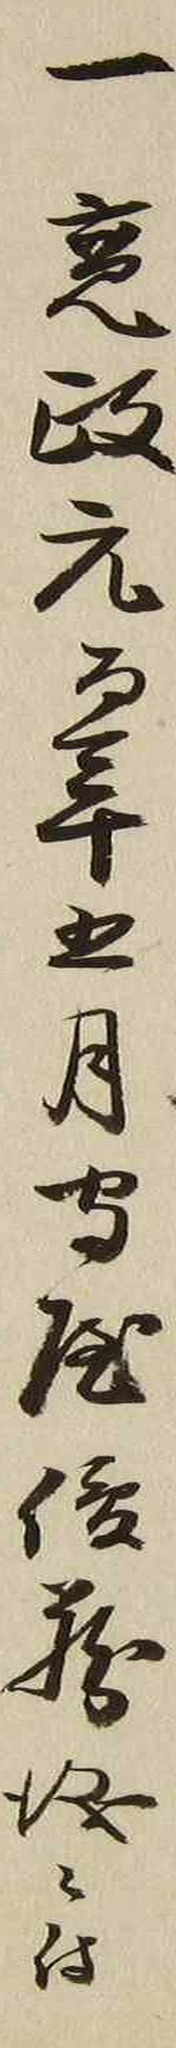一寛政元酉年五月守屋俊蔵儀ニ付
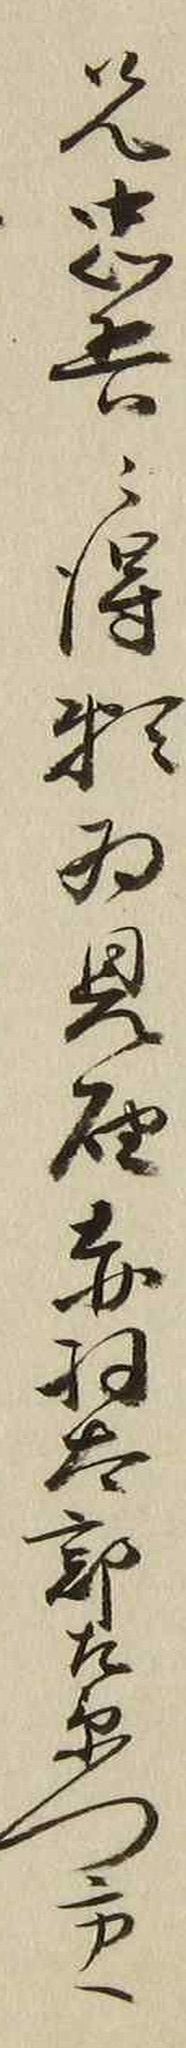兄忠吾ニ得願為見届赤羽太部左衛門方へ
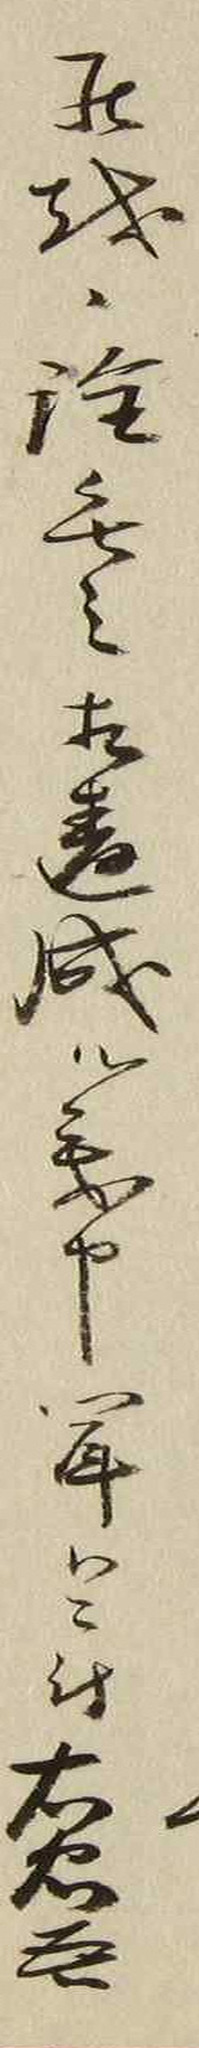罷越候詮無之相違成ル義申聞候ニ付右忠吾
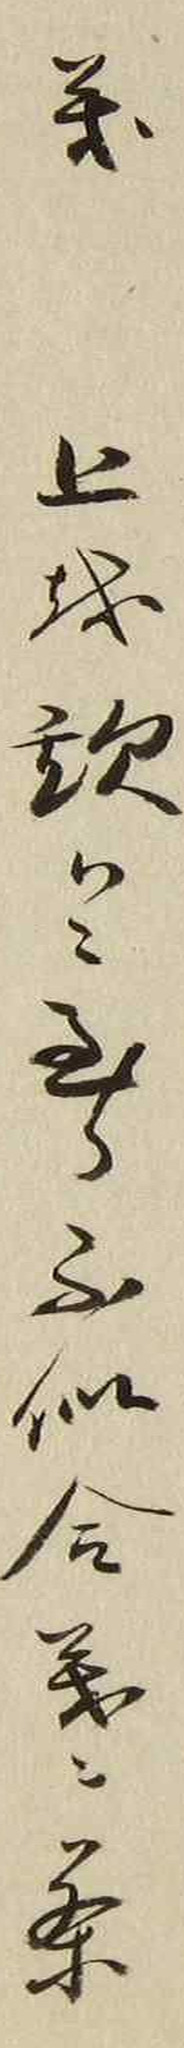義上越欺候ニ至り不似合義ニ候条
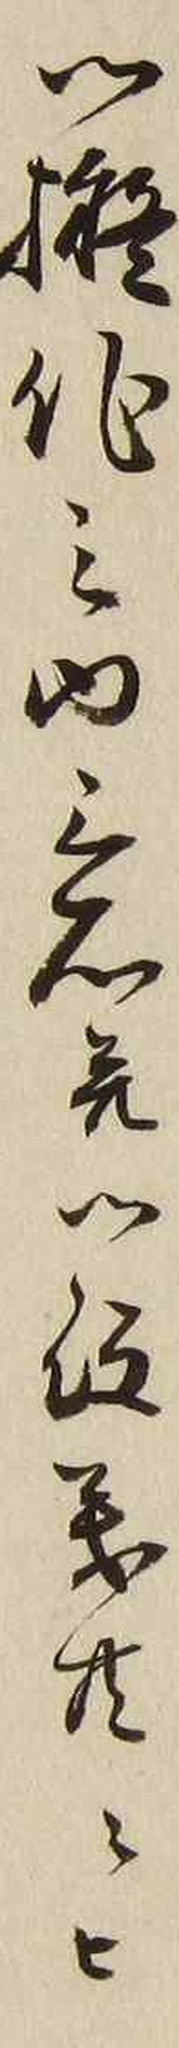御擬作之内三石并御役義共ニ被
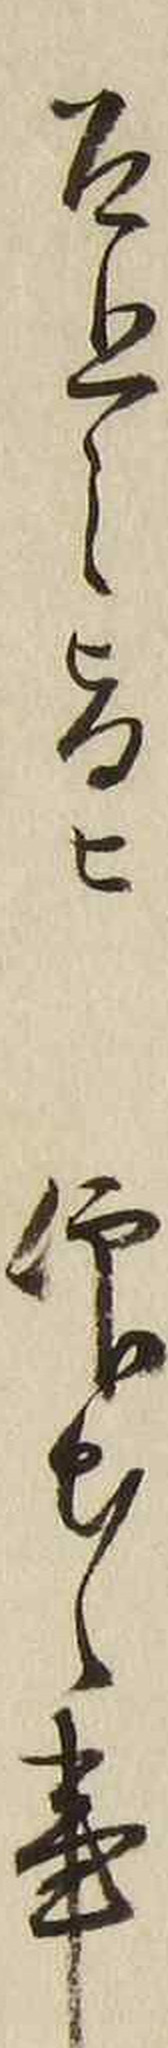召上之旨被仰出候事
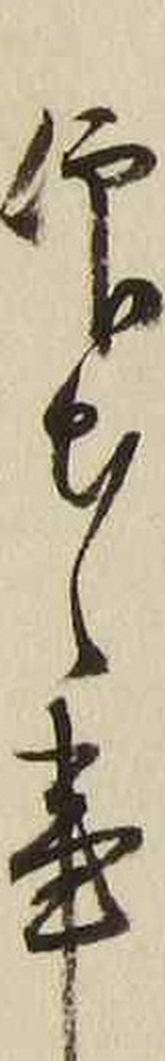仰付候事
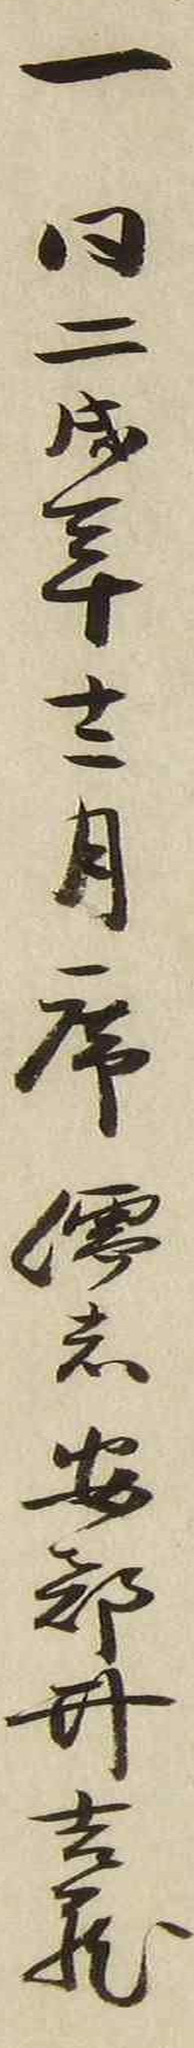一同二戌年十二月席儒者安部井吉蔵

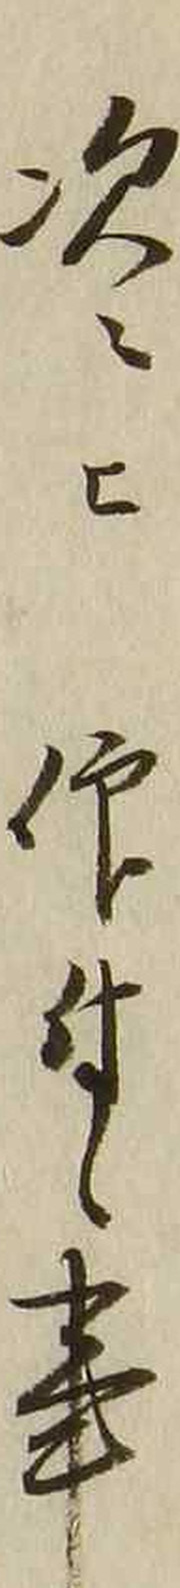次ニ被仰付候事
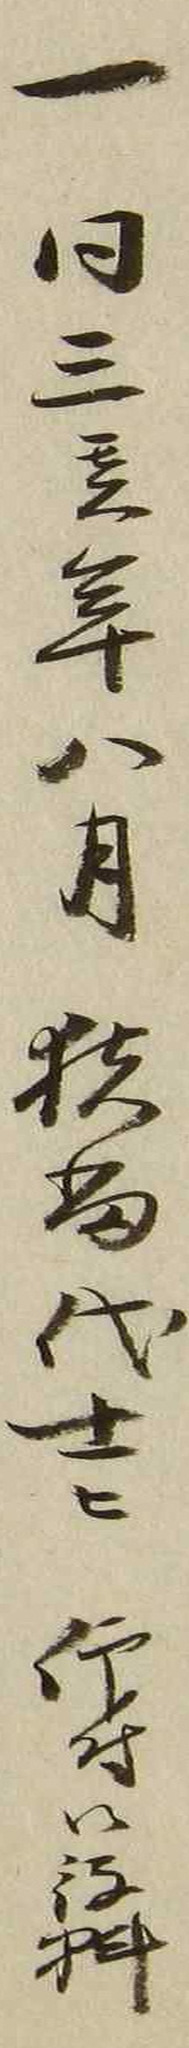一同三亥年八月猪苗代士被仰付御役料
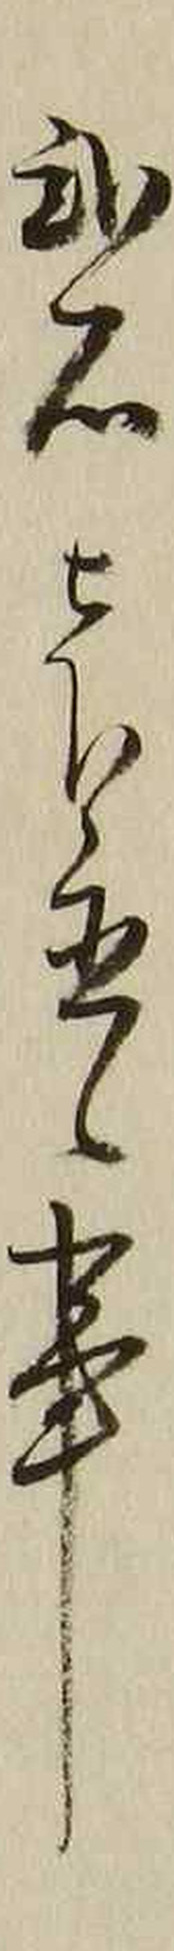弐石被下置候事
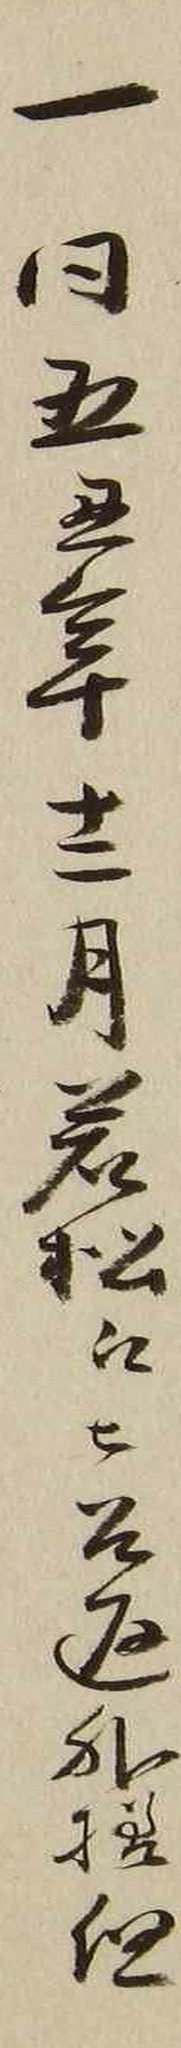一同五丑年十二月若松江被召返外様組
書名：諸士系譜　巻之288　さ之部20
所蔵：会津若松市立会津図書館
